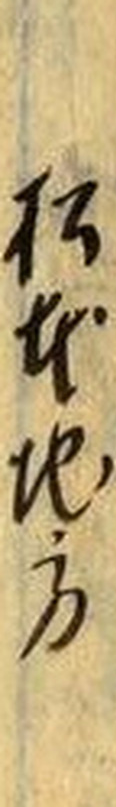松本地方
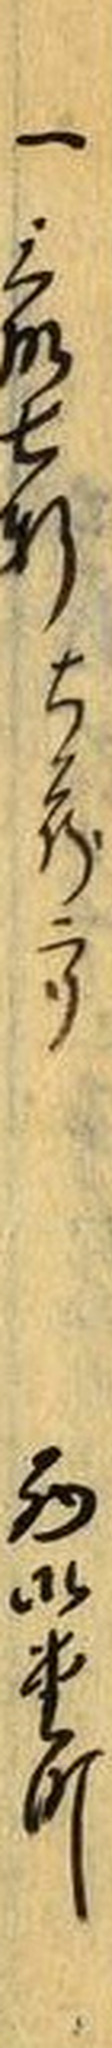一三拾七軒土蔵二ッ西御堂町
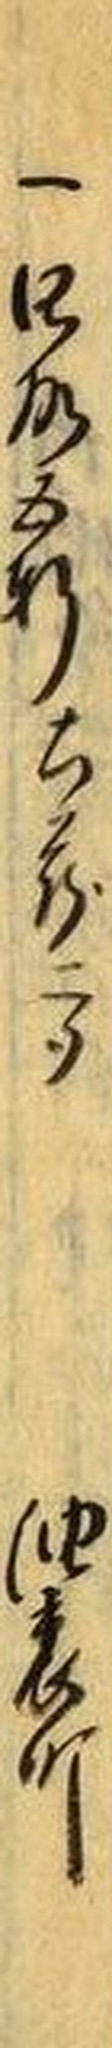一四拾五軒土蔵二ッ油表町
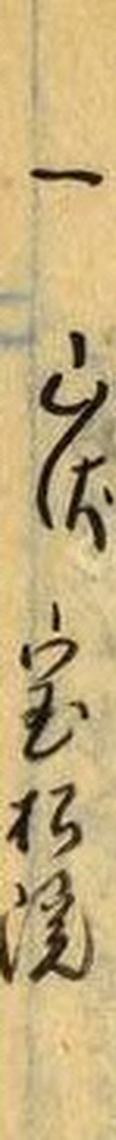一山伏宝松院

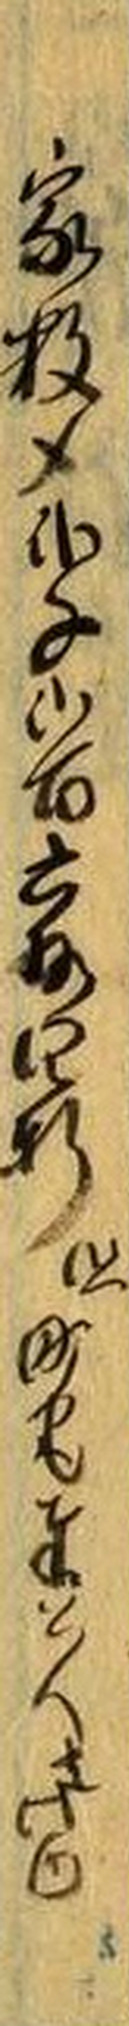家数〆弐千弐百六拾四軒但町宅奉公人は此内
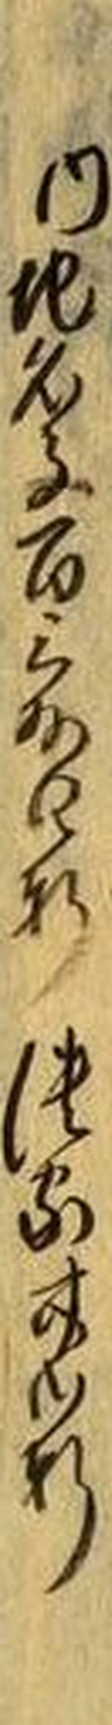内地名子百三拾四軒潰家廿弐軒
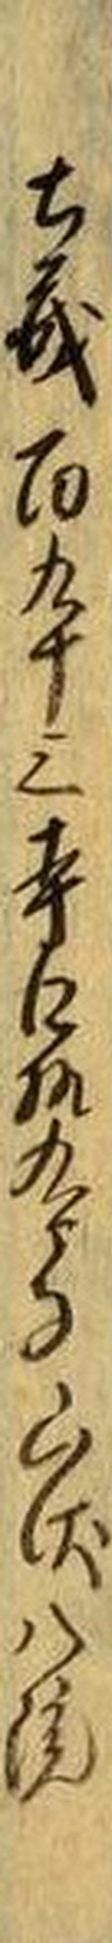土蔵百九十三寺四拾九ヶ寺山伏八院
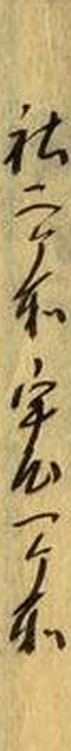社二ヶ所牢屋一ヶ所
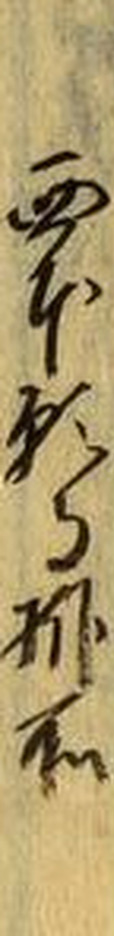西本願寺掛所
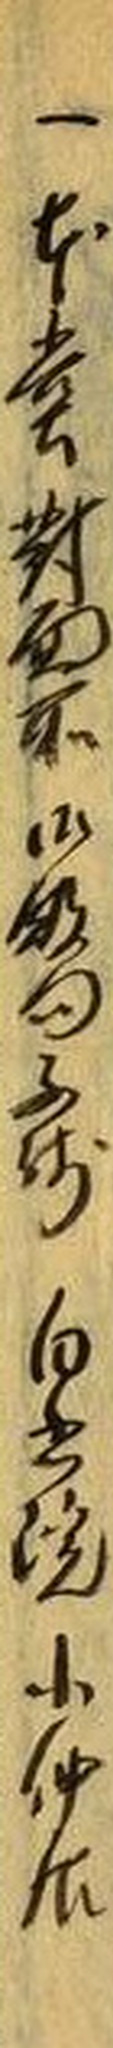一本堂対面所御殿向不残白書院小仲居
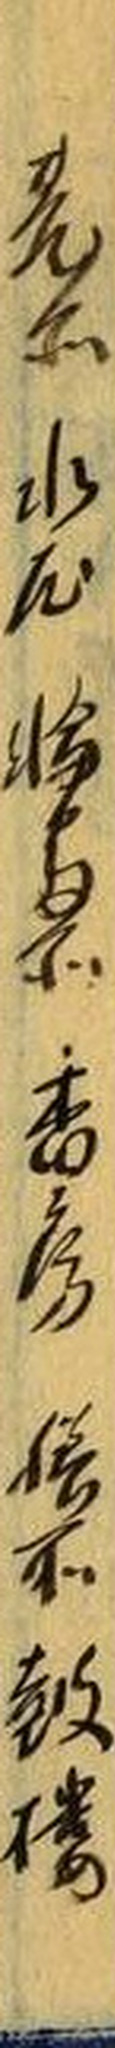台所水屋輪番所香房膳所鼓楼
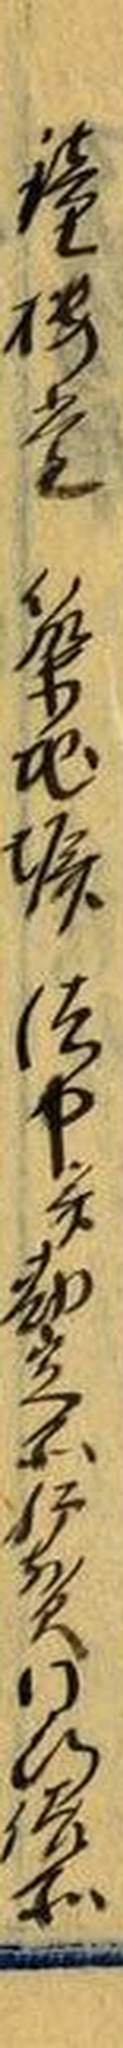鐘楼堂築地塀法中并勘定所伊賀同役詰所
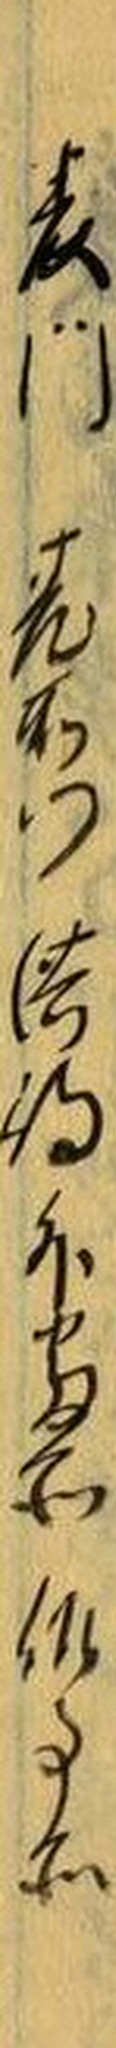表門台所門供侍外番所作事所
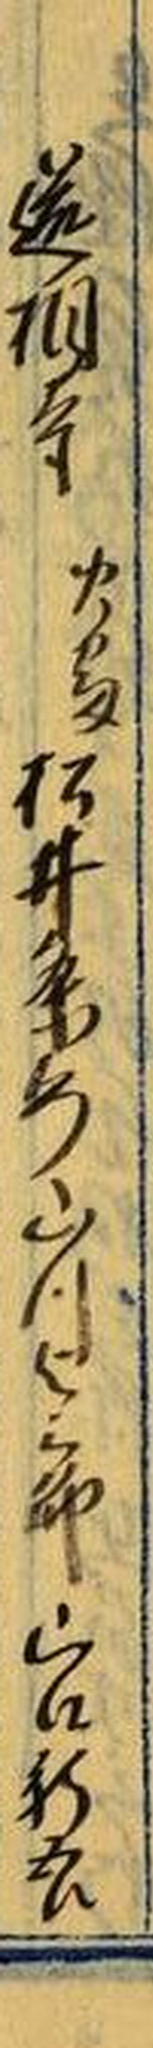還相寺火番松井粂右衛門山川与三郎山口新吾
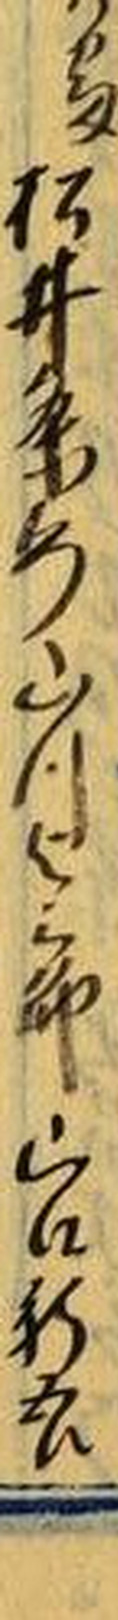還相寺火番松井粂右衛門山川与三郎山口新吾
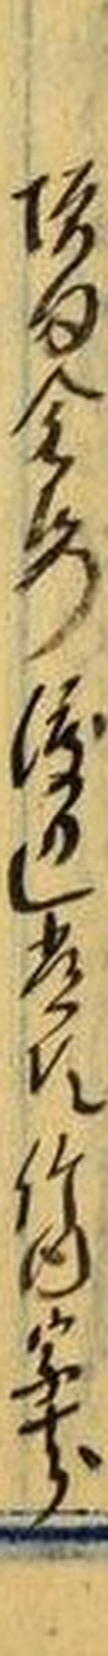増田金左衛門渡辺常次竹内宗十郎
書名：温古集 五巻
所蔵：福井県文書館 Fukui Prefectural Archives
